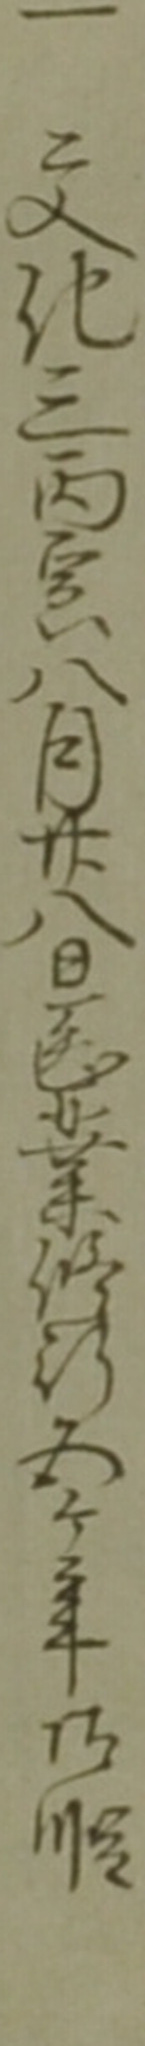一文化三丙寅八月廿八日医業修行五ヶ年御暇
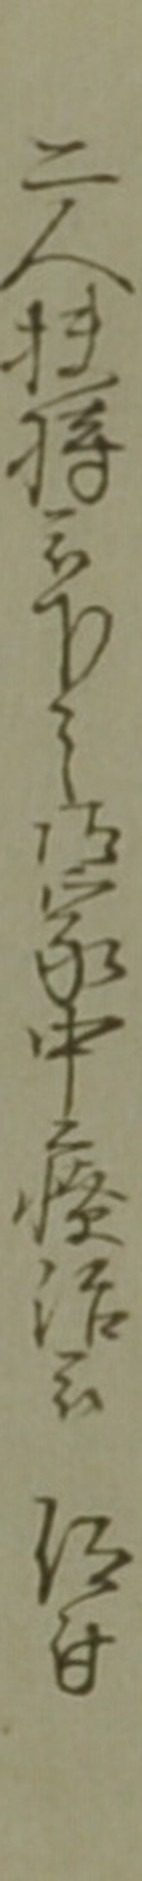二人扶持被下之御家中療治被仰付
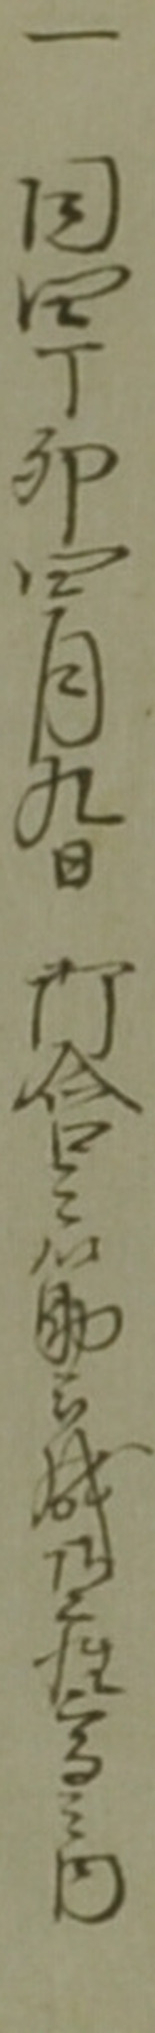一同四丁卯四月九日御含之筋被成御座高之内
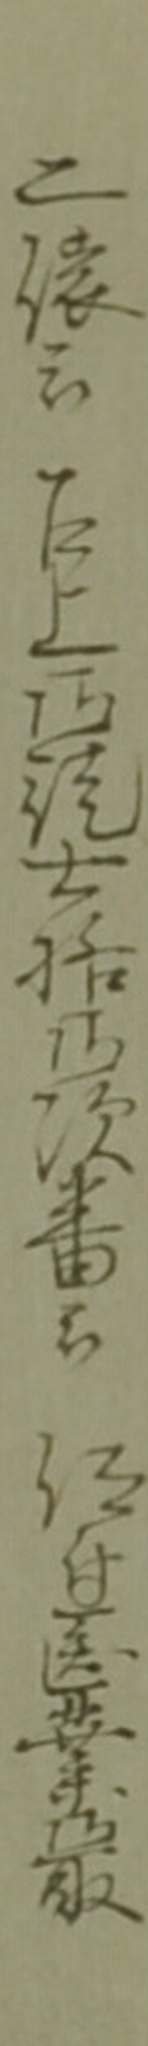二俵被召上御徒士格御次番被仰付医業御取
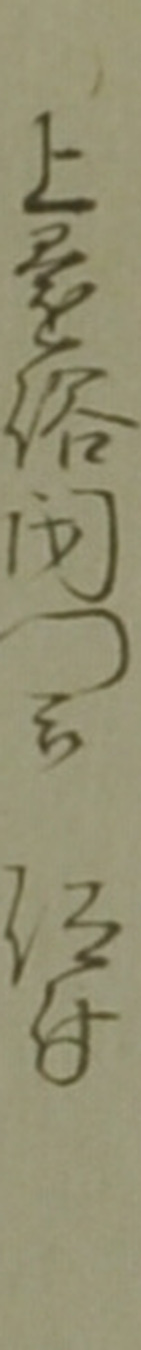上還俗閉門被仰付

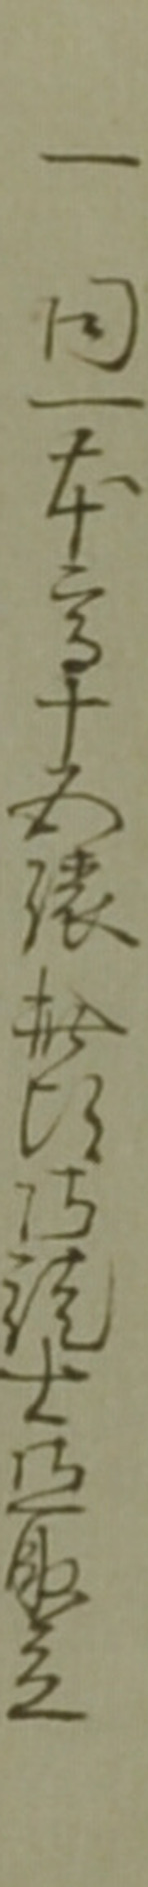一同一本高十五俵此頃御徒士御取立
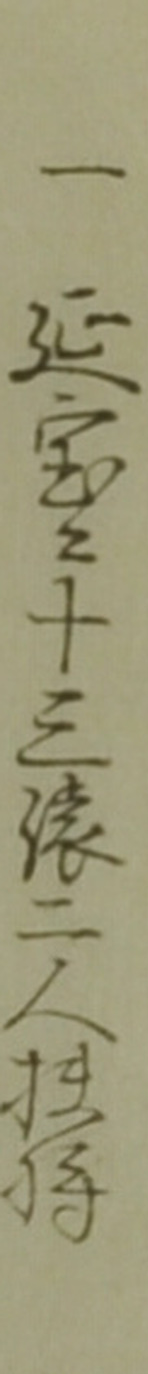一延宝十三俵二人扶持
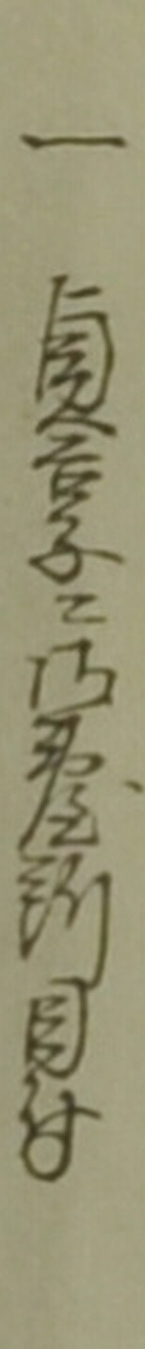一貞享御台所目付
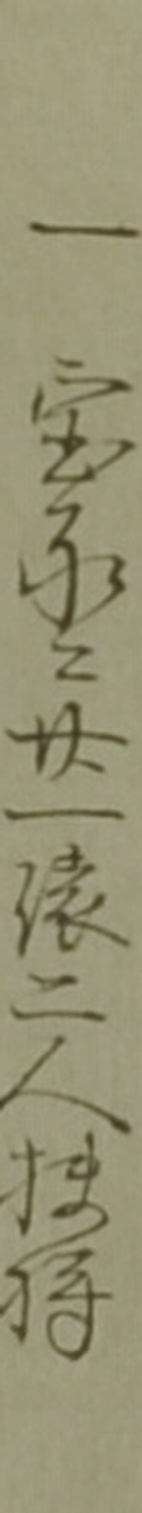一宝永廿一俵二人扶持
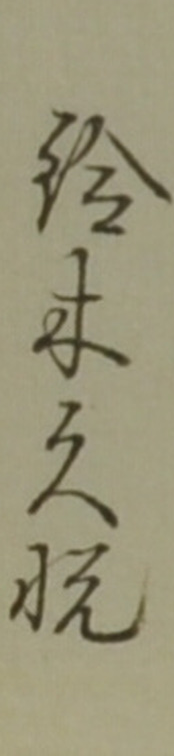鈴木久悦
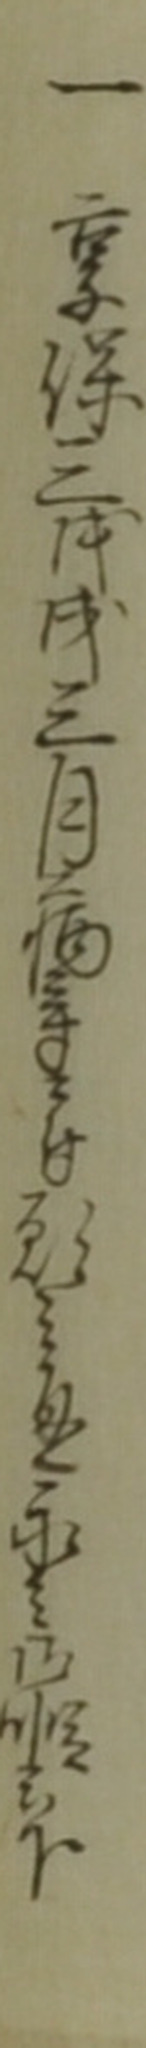一享保三戊戌三月病気ニ付願之通永之御暇被下
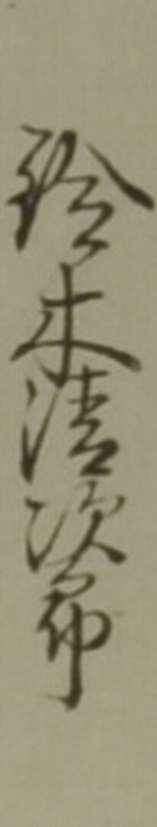鈴木清次郎

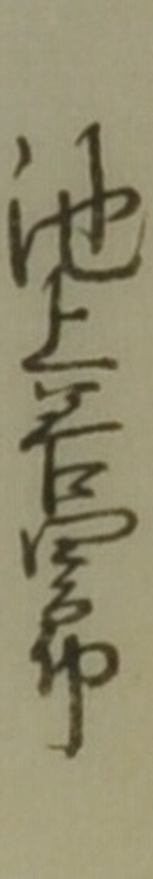池上善四郎

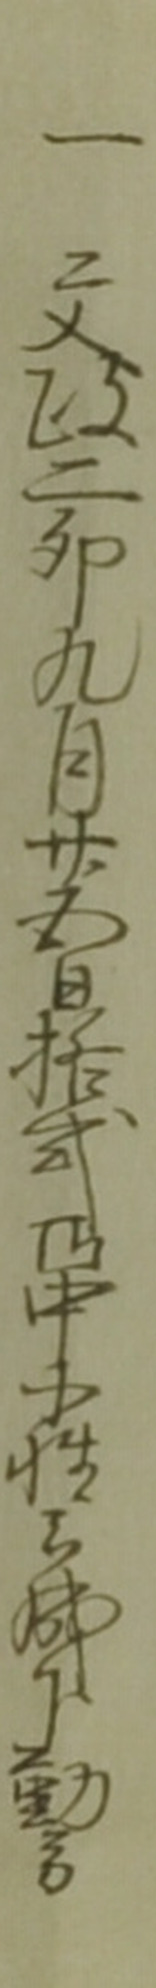一文政二卯九月廿五日格式御中小性被成下勤方
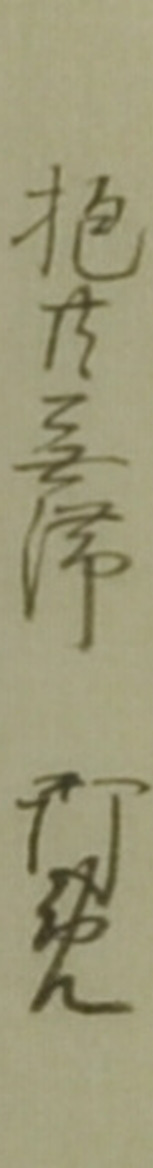抱共無滞御免
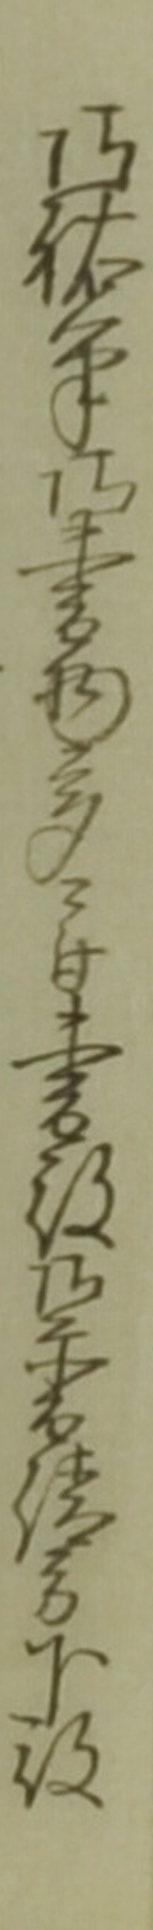御祐筆御書物多ニ付書役御普請方下役
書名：無足廃家（弐）
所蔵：伊那市立高遠町図書館・合同会社AMANE
